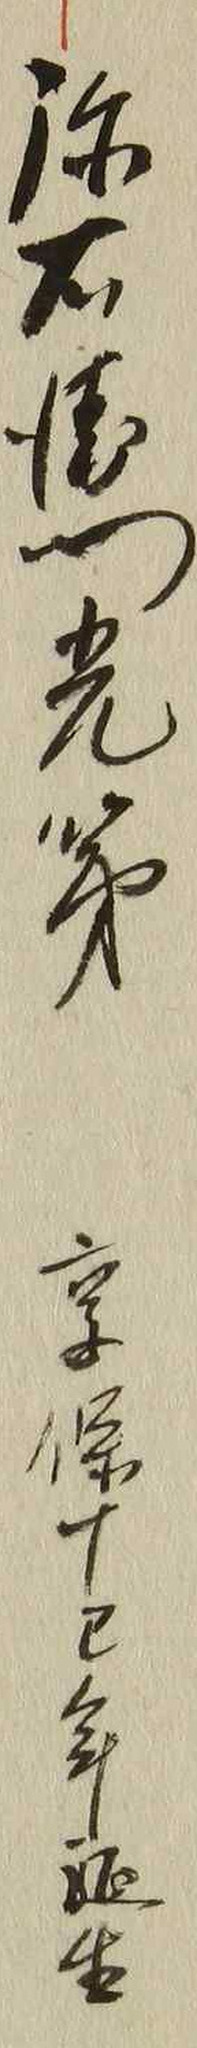弥右衛門光第享保十巳年誕生
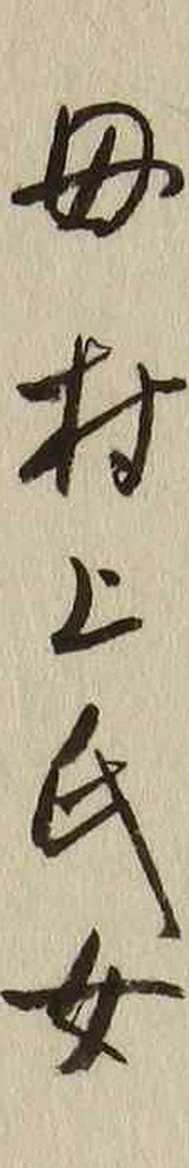母村上氏女
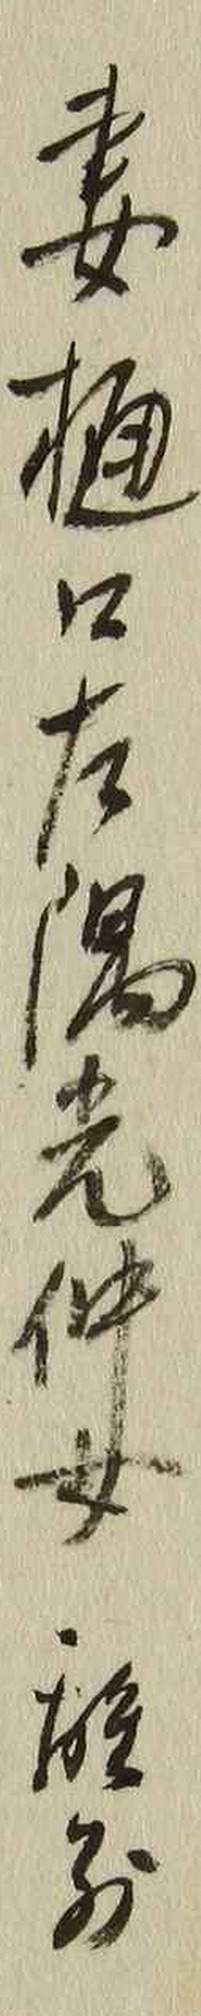妻樋口左陽光仲女離別
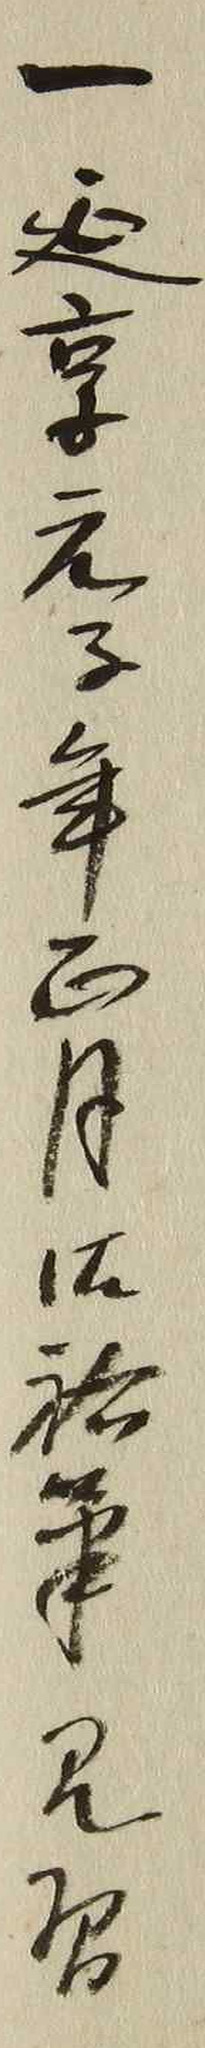一延享元子年正月御祐筆見習
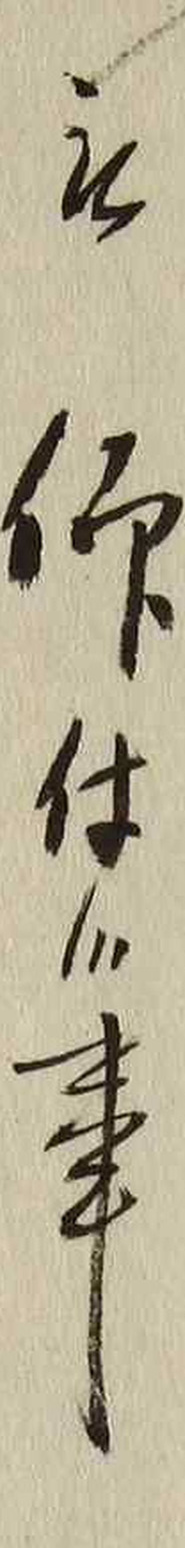被仰付候事
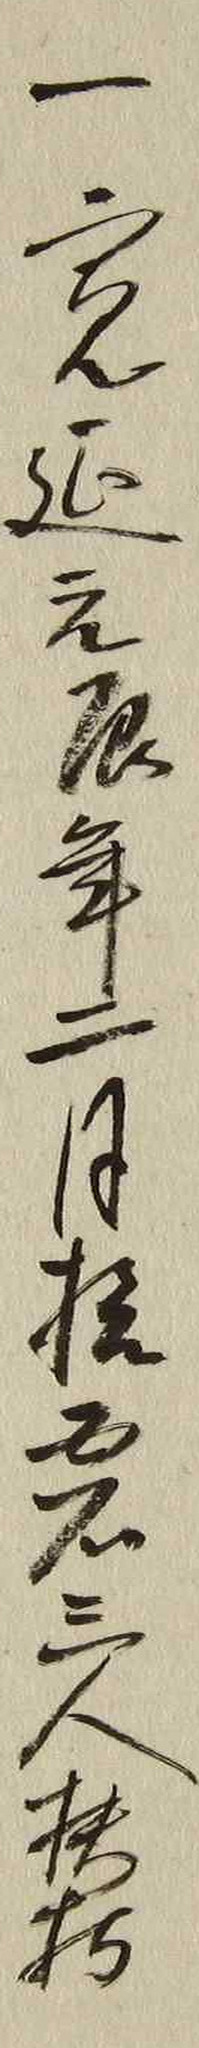一寛延元辰年二月拾五石三人扶持
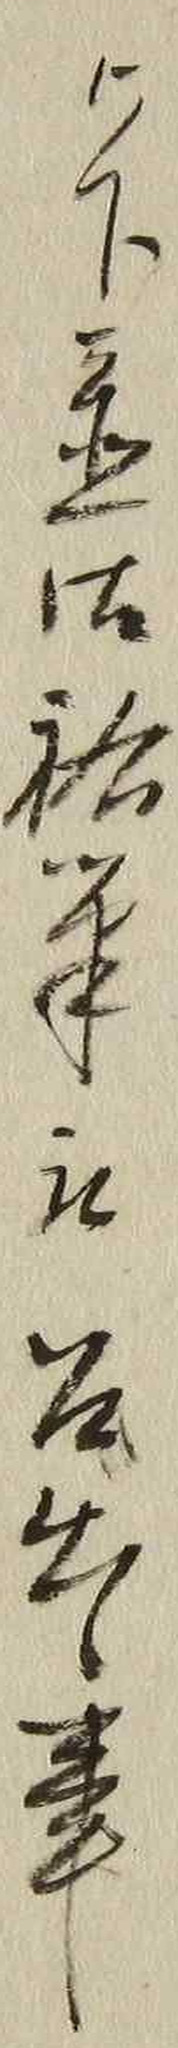被下置御袷筆被召出候事
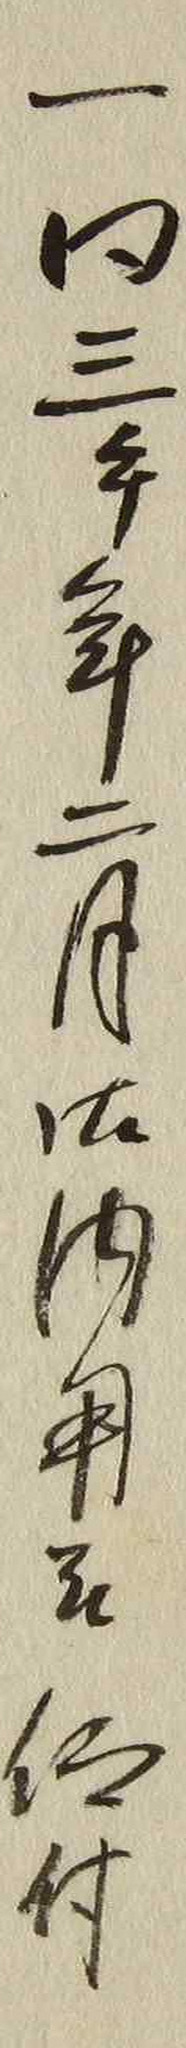一同三午年二月御内用被仰付
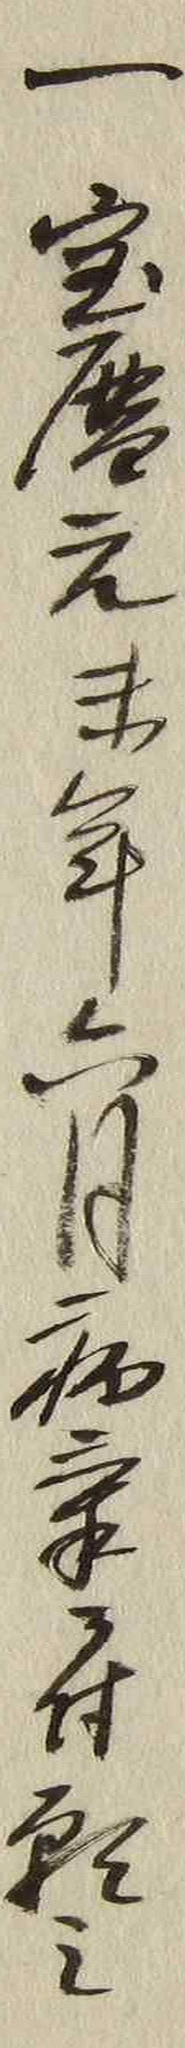一宝暦元未年六月病気ニ付願之
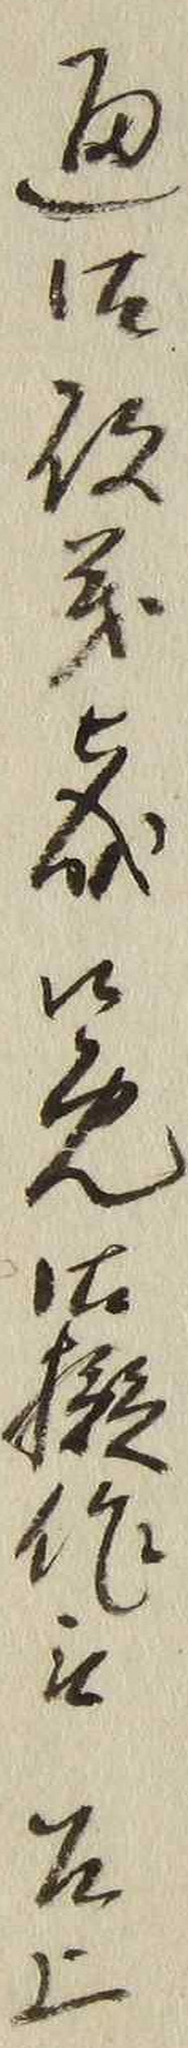通御役義被成御免御擬作被召上
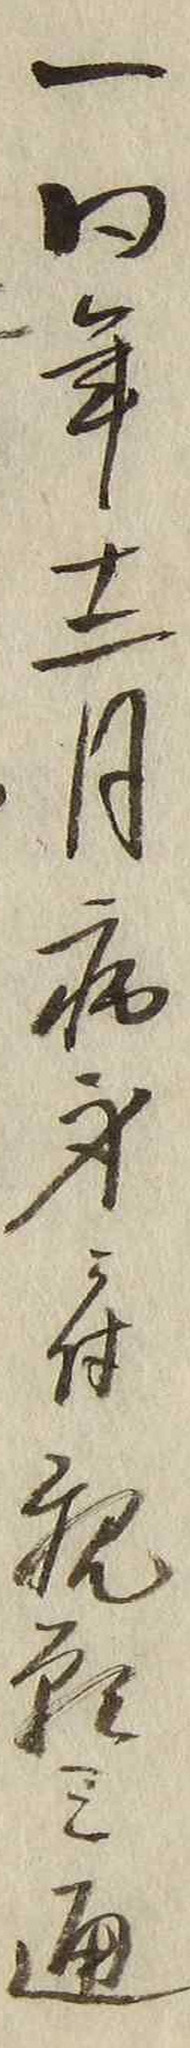一同年十二月病身ニ付親願之通
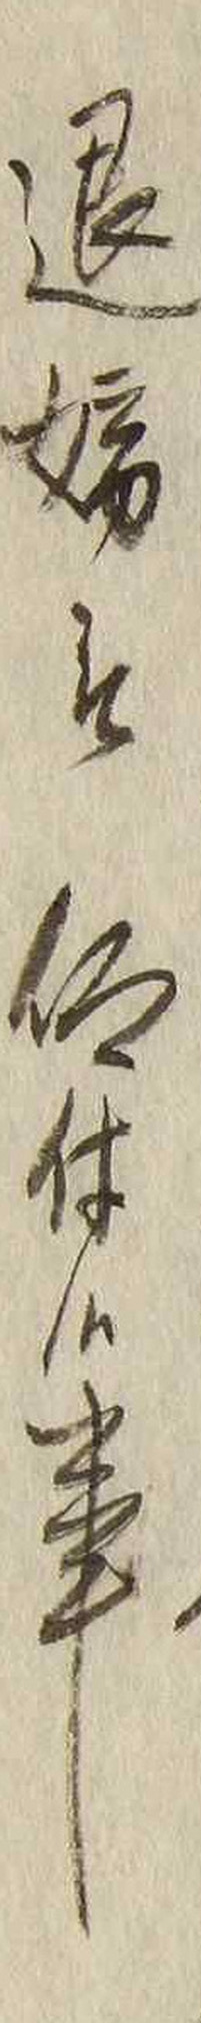退嫡被仰付候事

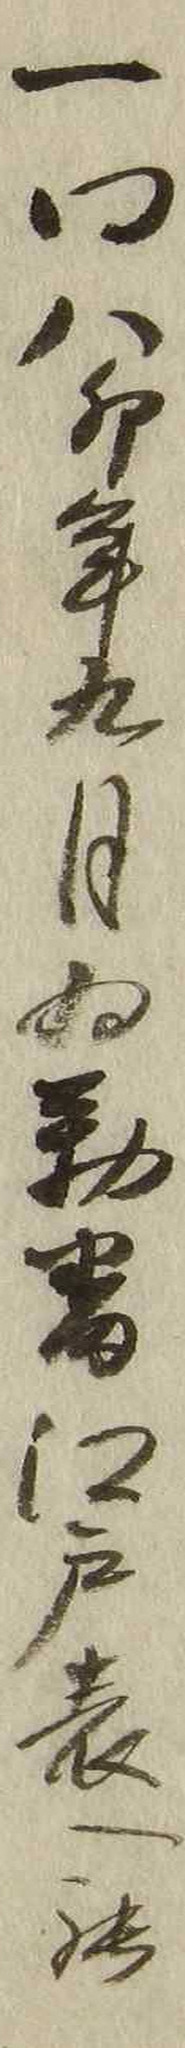一同八卯年九月為勤番江戸表へ罷
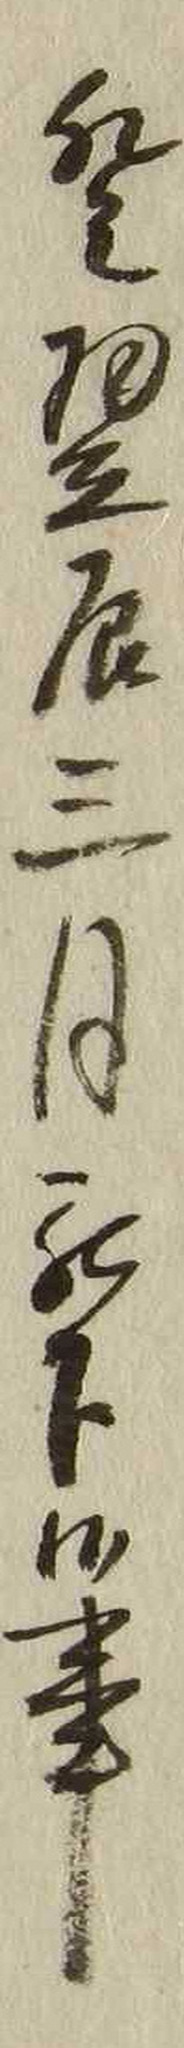登翌辰三月罷下候事
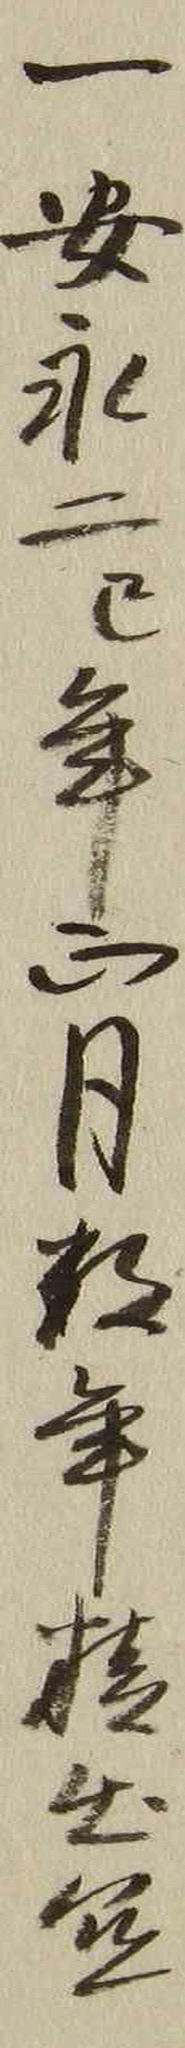一安永二巳年正月数年精出宜
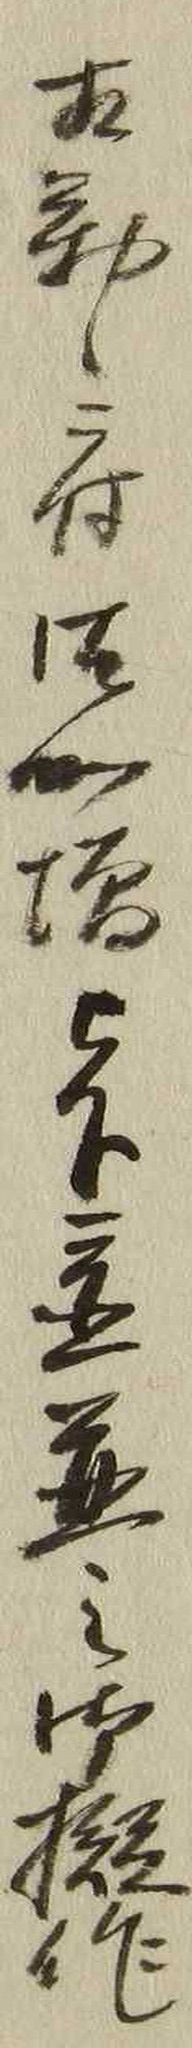相勤候ニ付御加増被下置並之御擬作
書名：諸士系譜　巻之359　す之部9
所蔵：会津若松市立会津図書館
